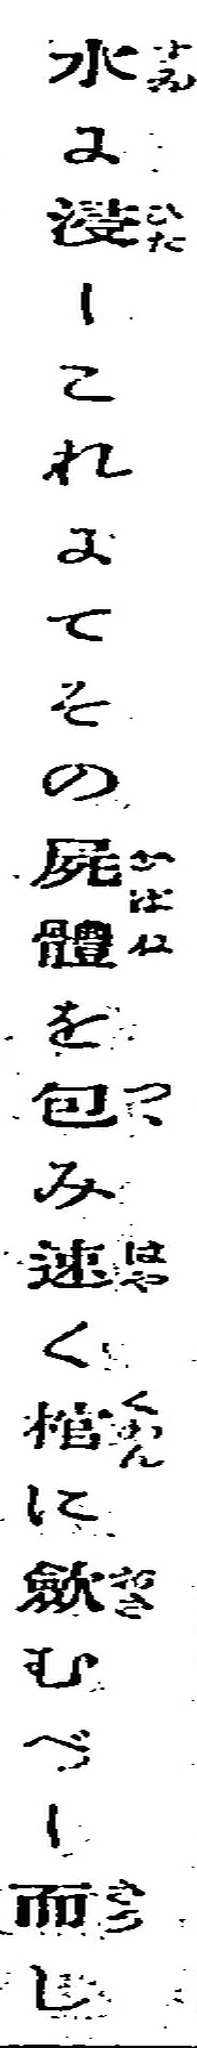水に浸しこれにてその屍體を包み速く棺に歛むべし而し
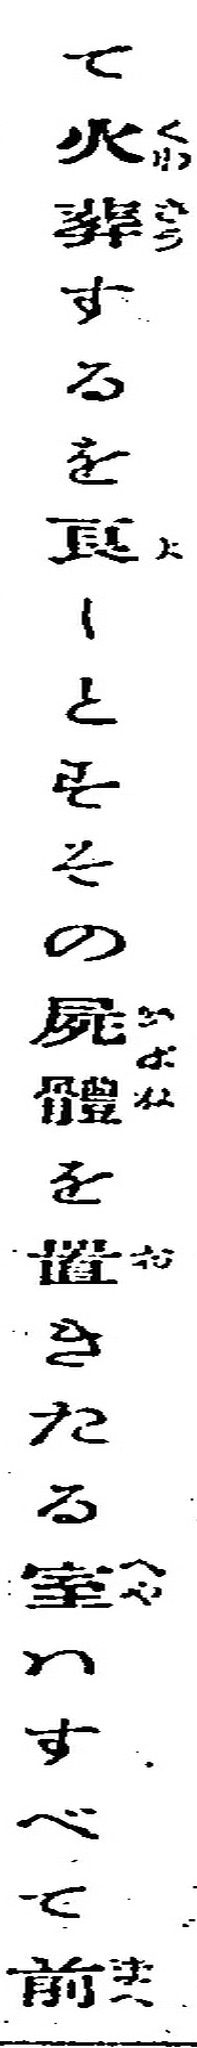火葬するを良しとすその屍體を置きたる室はすべて前
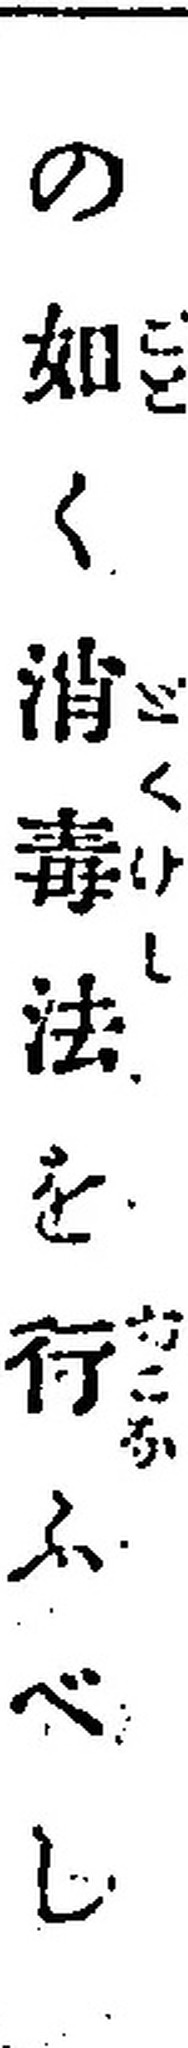の如く消毒法を行ふべし
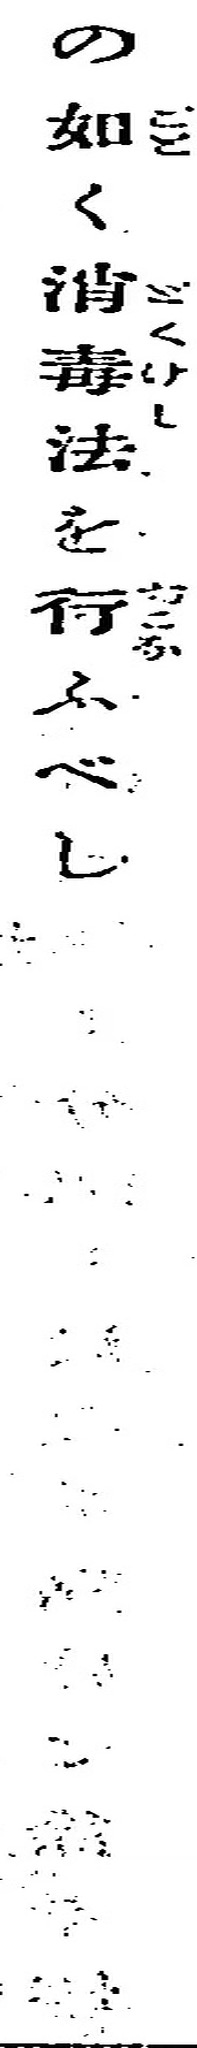の如く消毒法を行ふべし
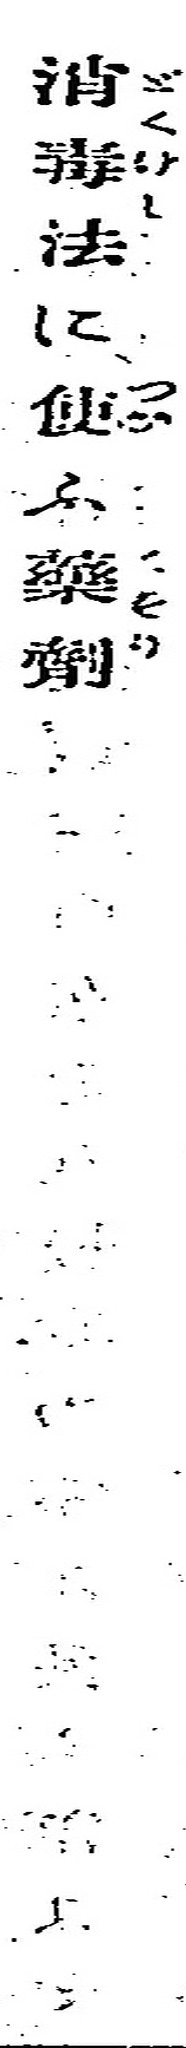消毒法に使ふ藥劑
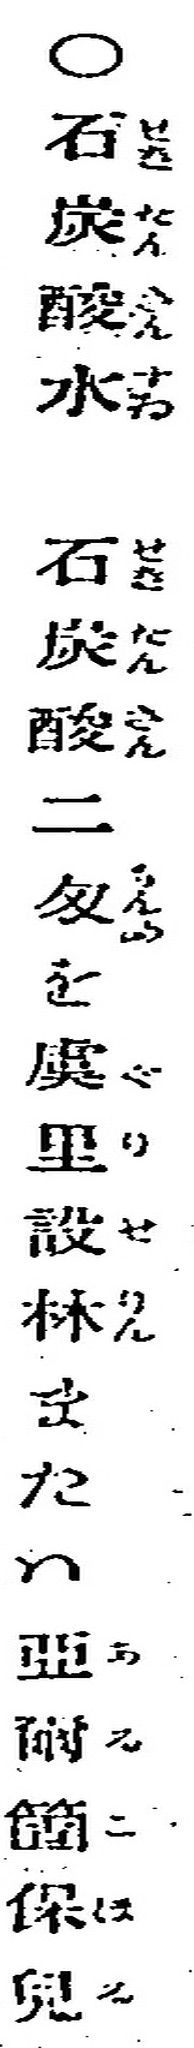〇石炭酸水石炭酸二匁を虞里設林または亞薾箇保兒
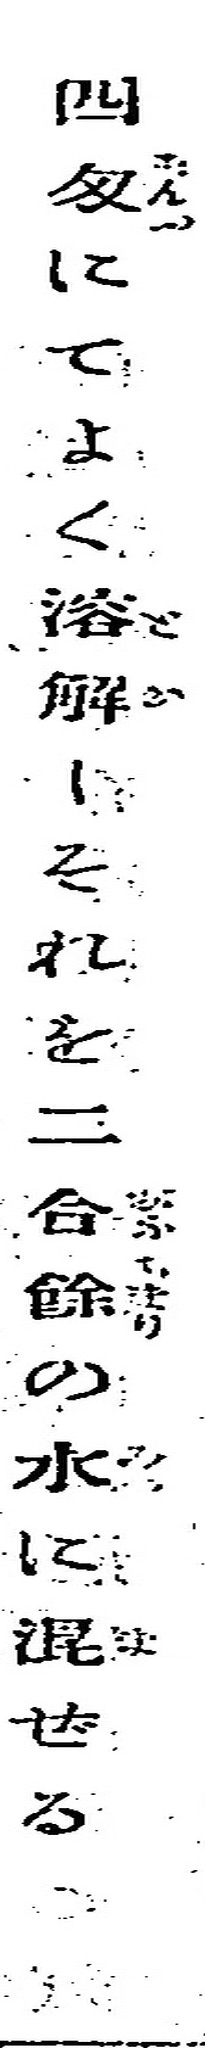四匁にてよく溶解しそれを二合餘の水に混ぜる
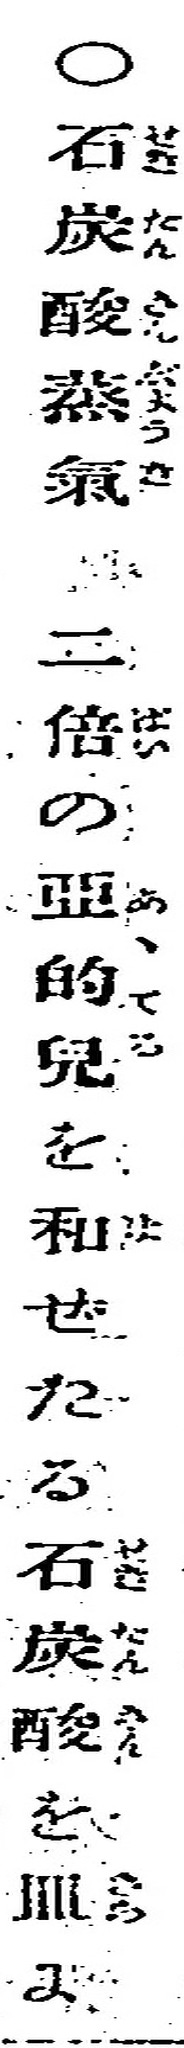〇石炭酸蒸気二倍の亞的兒を和ぜたる石炭酸を皿に

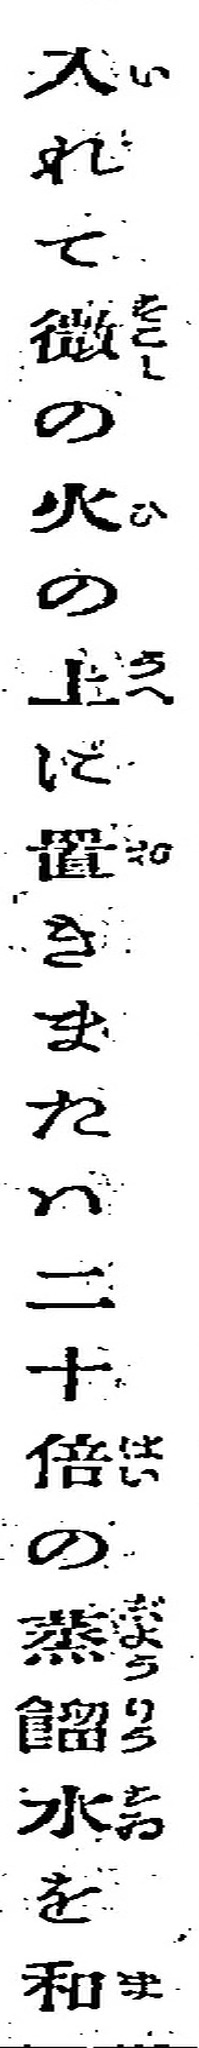入れて微の火の上に置きまたは二十倍の蒸餾水を和
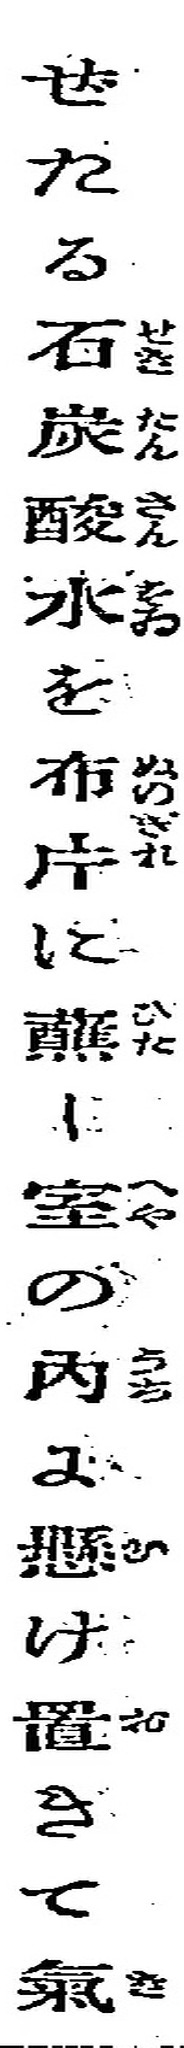ぜたる石炭酸水を布片に蘸し室の内に懸け置きて氣
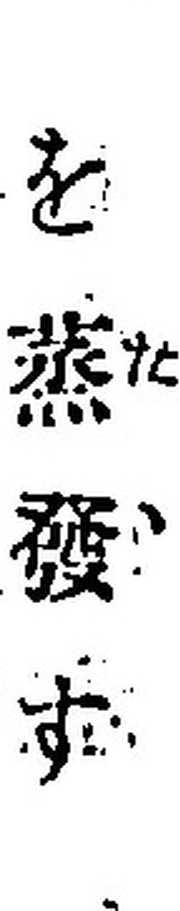を蒸發す
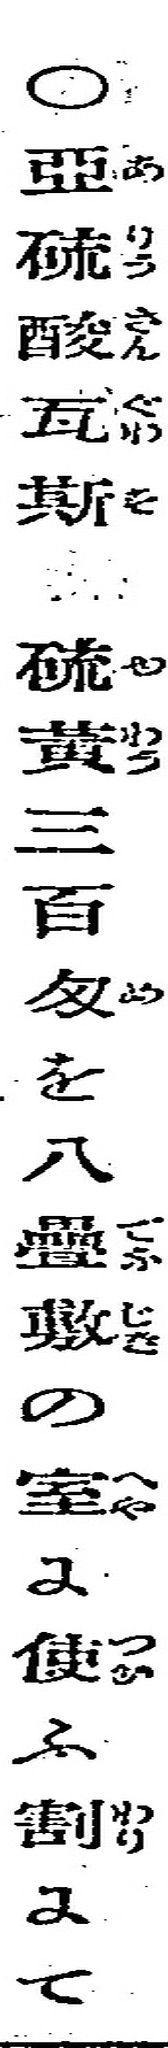〇亞硫酸瓦斯硫黄三百匁を八畳敷の室に使ふ割にて
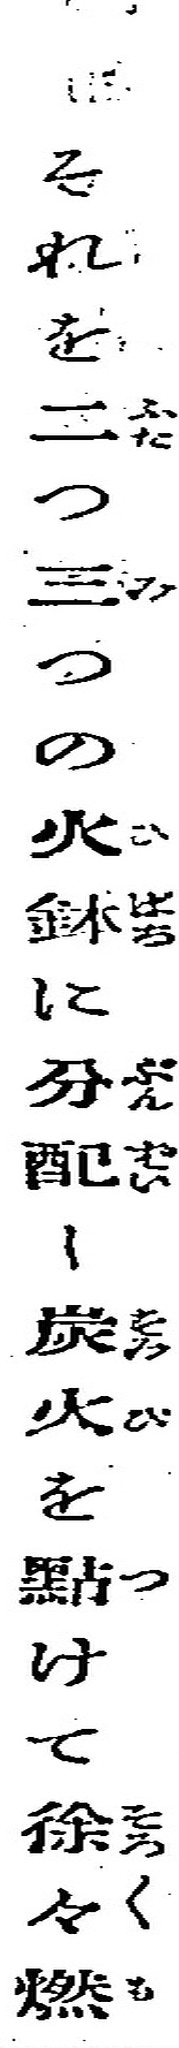それを二つ三つの火鉢に分配し炭火を點けて徐々燃
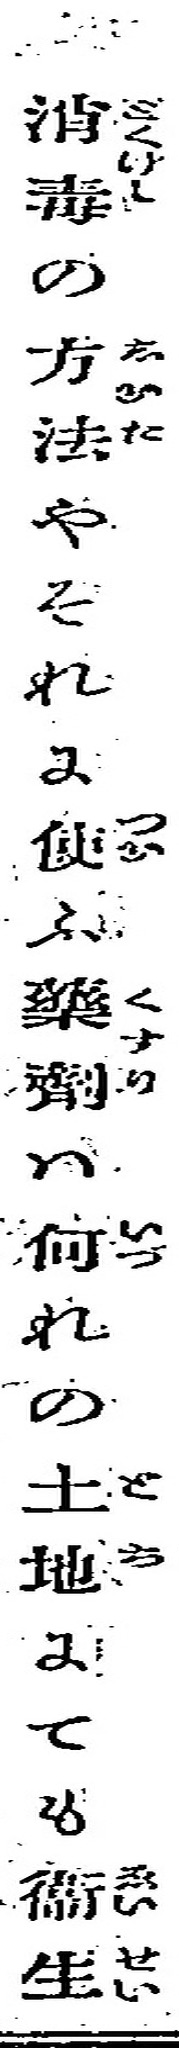消毒の方法やそれに使ふ藥劑は何れの土地にても衛生
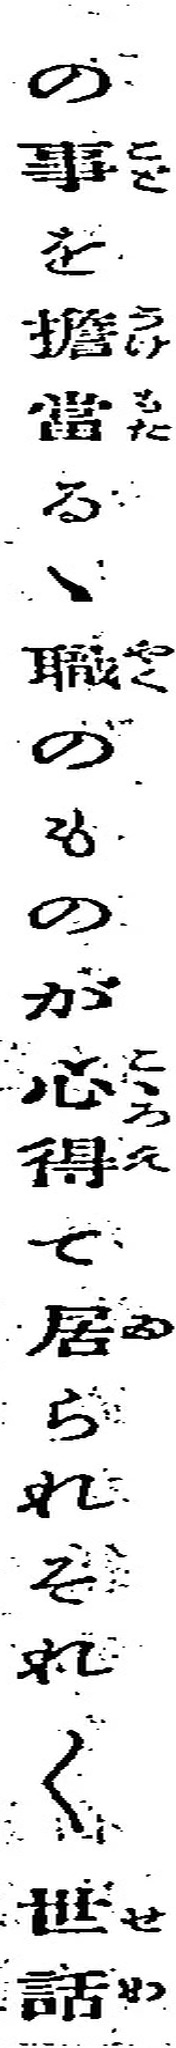の事を擔當るゝ職のものが心得て居られそれ〳〵世話
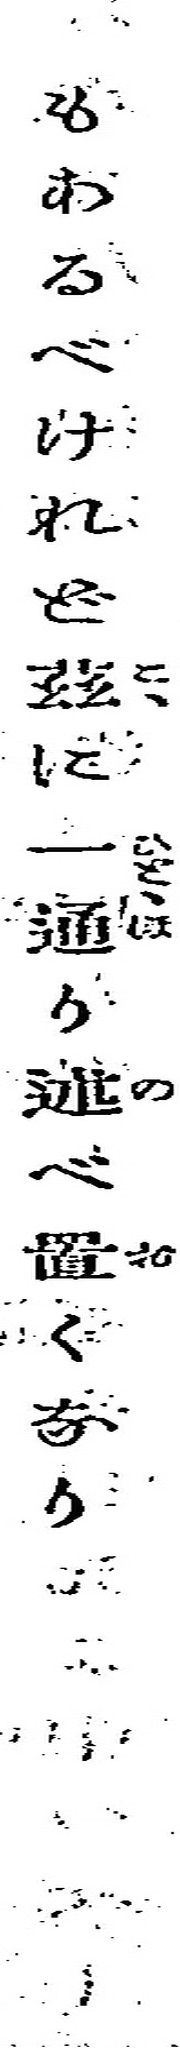もあるべけど茲に一通り述べ置くなり
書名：発疹窒扶私予防の訓
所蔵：国立国会図書館 National Diet Library, JAPAN
